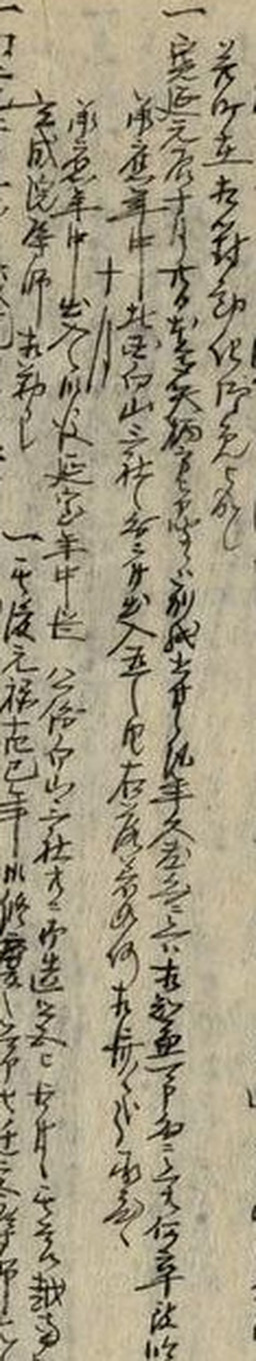承応年中北国白山三社之義ニ付出入有之由右落着如何相済候哉承度候
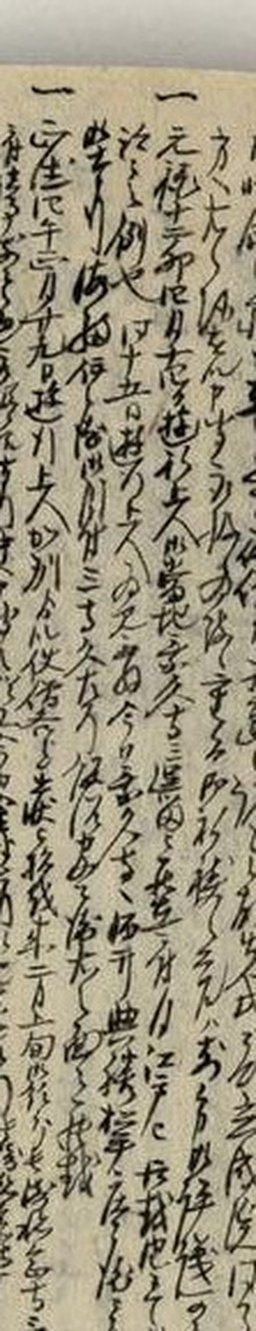跡々之例也同十五日遊行上人為見舞今日乗久寺へ酒井典膳松平庄兵衛被罷越
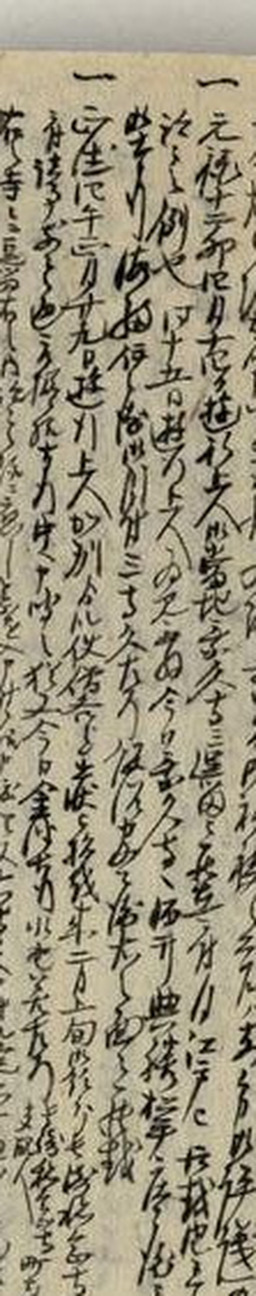御奉行海福伊兵衛御目付三寺久左衛門飯沼官兵衛右之面々罷越
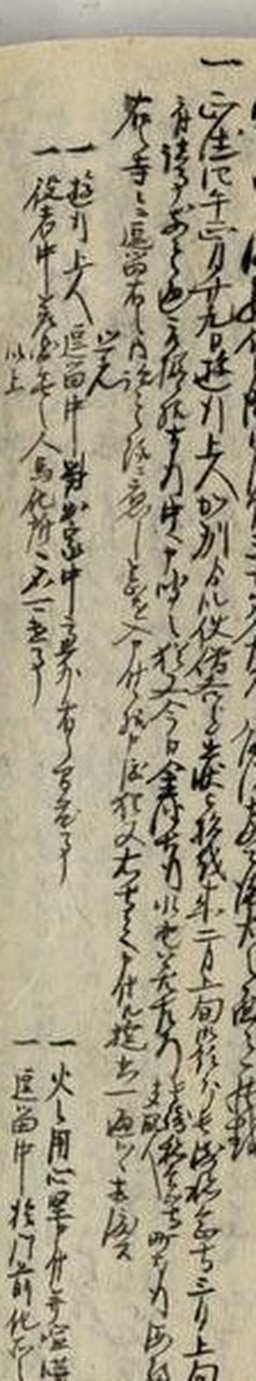右之寺々二逗留右之内跡々之趣ニ応し念を入申付候様申渡猶又右寺々へ申付ル達書一通ツヽ相渡ス
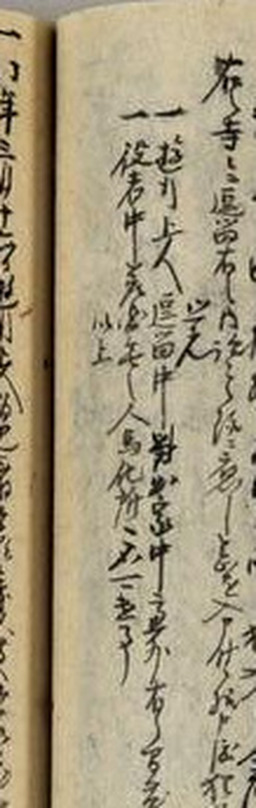一役者中差図無之人馬他所へ不可遣事
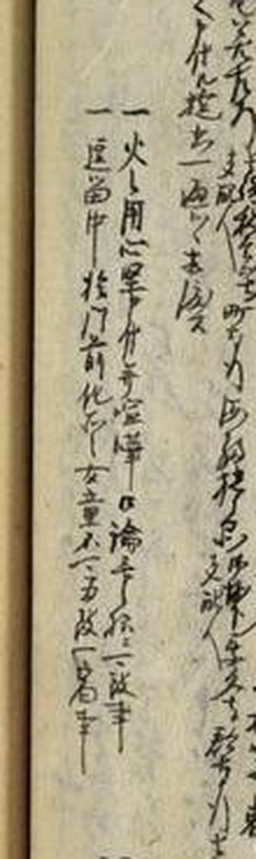一火之用心堅申付幷喧嘩口論無之様ニ可致事
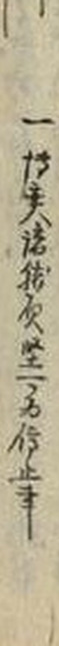一博奕諸勝負堅可為停止事
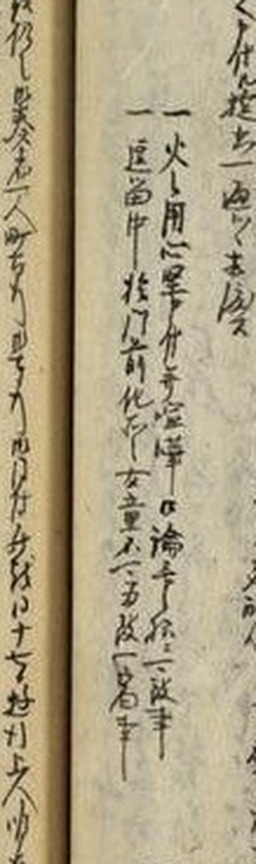一逗留中於門前他所之女童不可為致一宿事
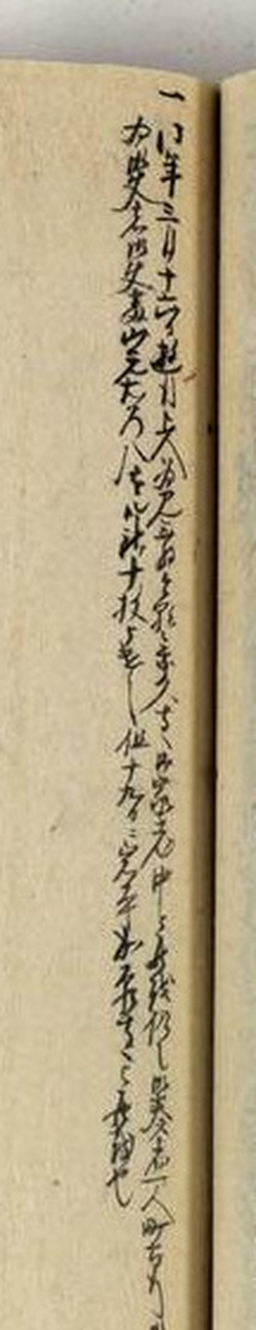為御使者御使番山元右衛門八を以銀十枚被遣之但十九日ニ岩本成願寺へ被罷越也

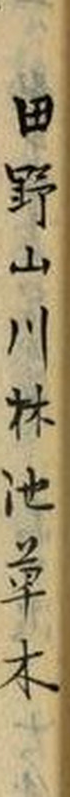田野山川林池草木
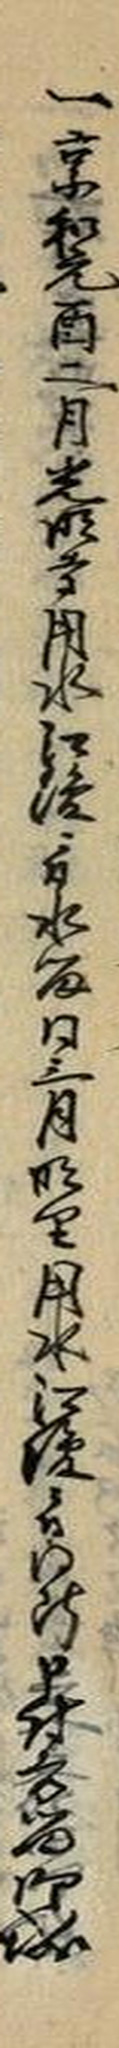一享和元酉二月光明寺用水江浚ニ付水留同三月明里用水江浚ニ付同断申付方留御城
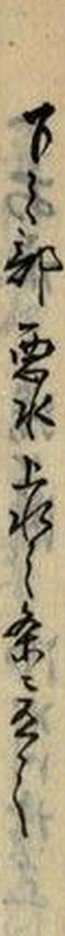下之部悪水上水之条ニ有之
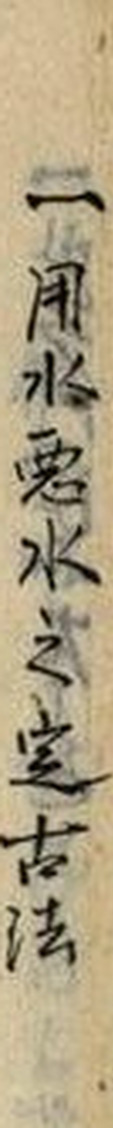一用水悪水之定古法
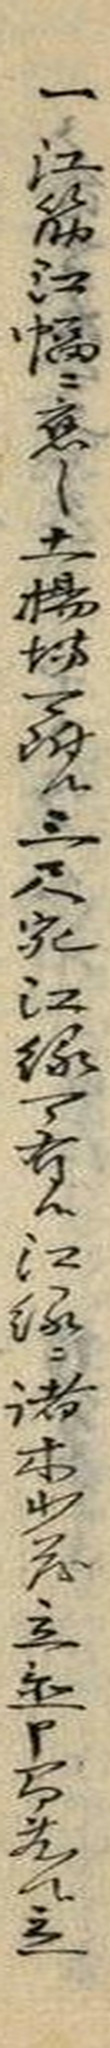一江筋江幅ニ応し土揚場可附候三尺宛江縁可有候江縁ニ諸木少茂立置申間敷候立
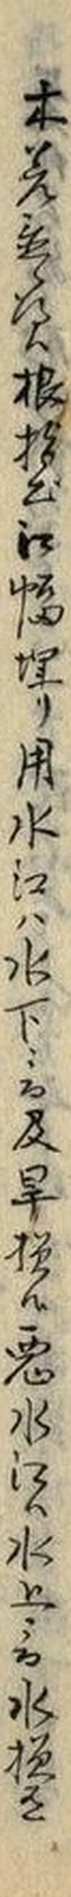木差置候得ハ根指出江幅埋り用水江ハ水下ニ而及旱損候悪水江ハ水上ニ而水損有
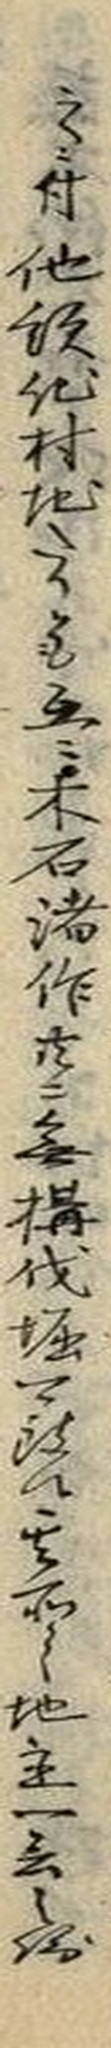之ニ付他領他村地たりとも互ニ木石諸作共ニ無構伐堀可致候其所之地主一言之儀
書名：御国他国諸事之部
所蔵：福井県文書館 Fukui Prefectural Archives
